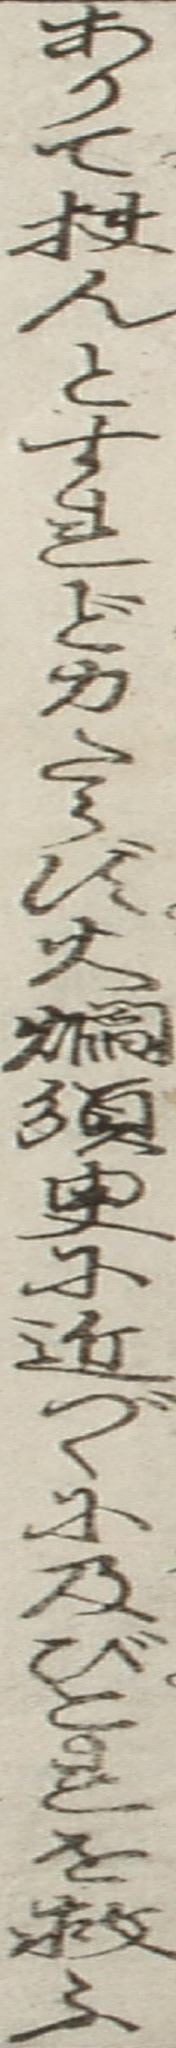ありて。扶んとすれど力たらず。火爓須臾に近づくに及び。これを救ふ
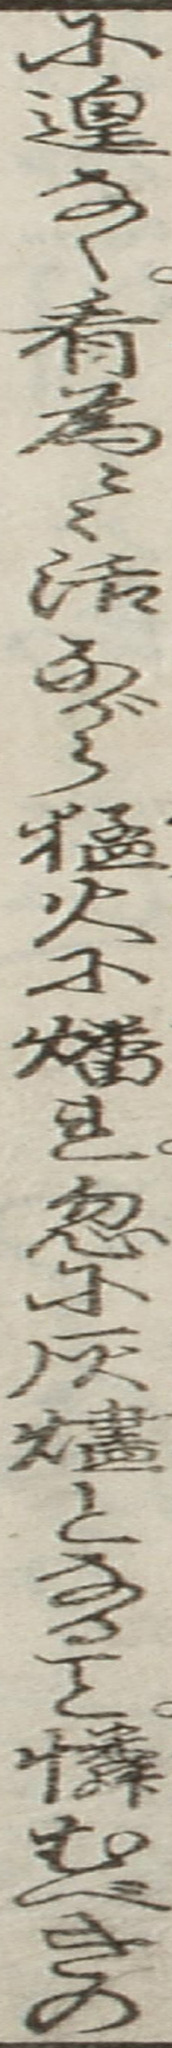に遑なく。看為〻〻活ながら猛火に燔れ。忽に灰燼となること。憐むべきの
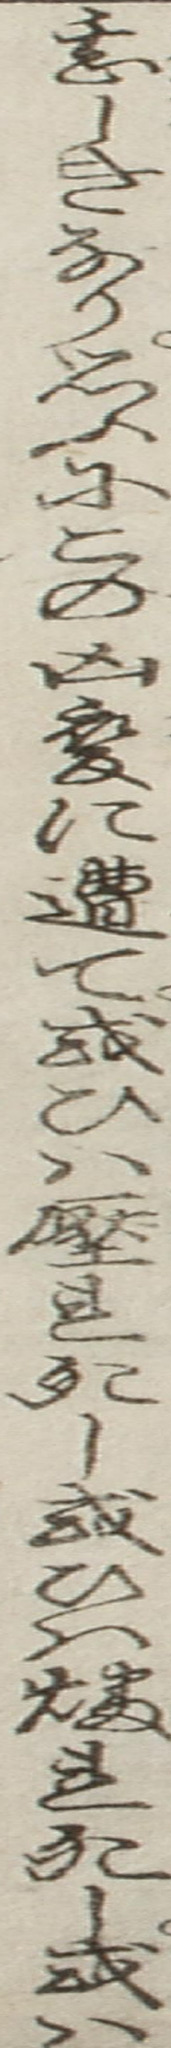甚しきなり。思ふにこの凶変に遭て。或ひは圧れ死し或ひは焼れ死し。或は
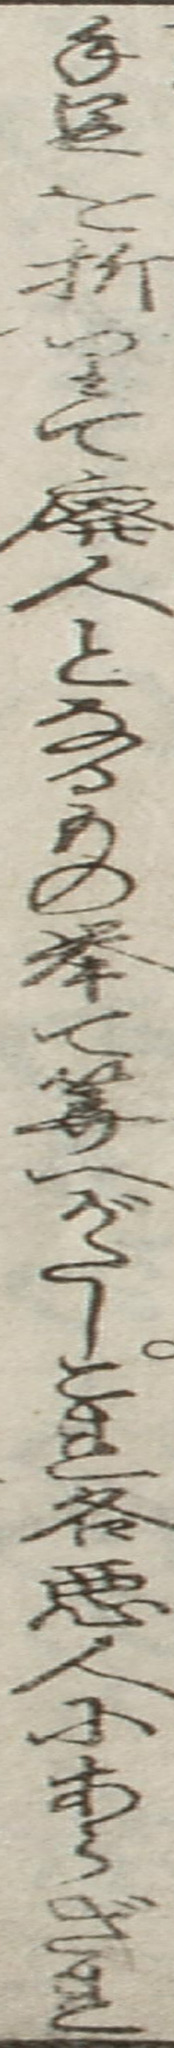手足を折りて廃人となるもの挙て算へがたし。これ各悪人にあらざれ
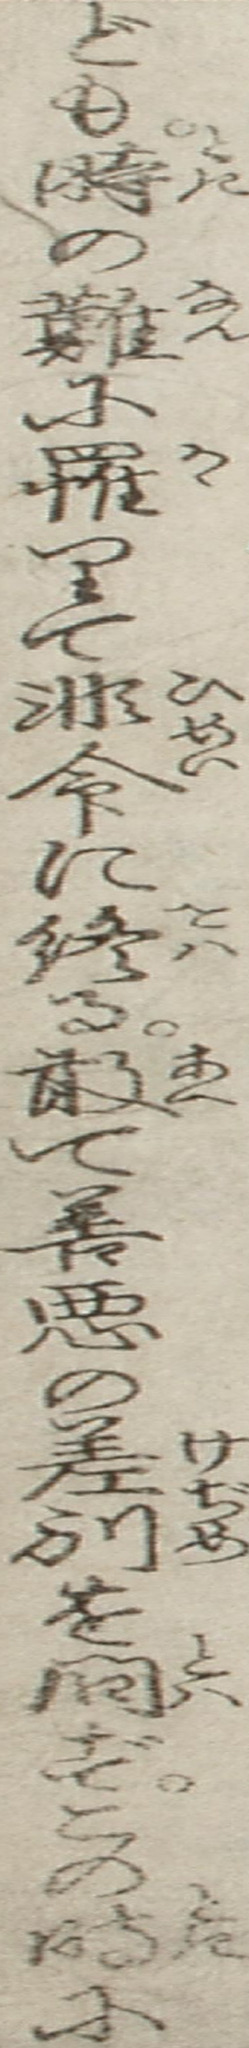ども時の難に罹りて非命に終る。敢て善悪の差別を問ず。この時に

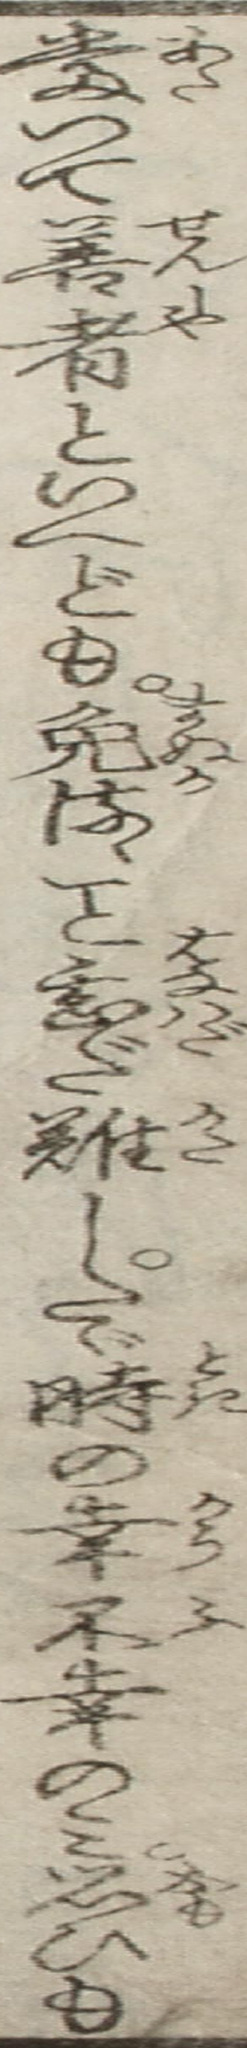当つて善者といへども。免るゝこと甚だ難し。たゞ時の幸不幸のみ。思ひも
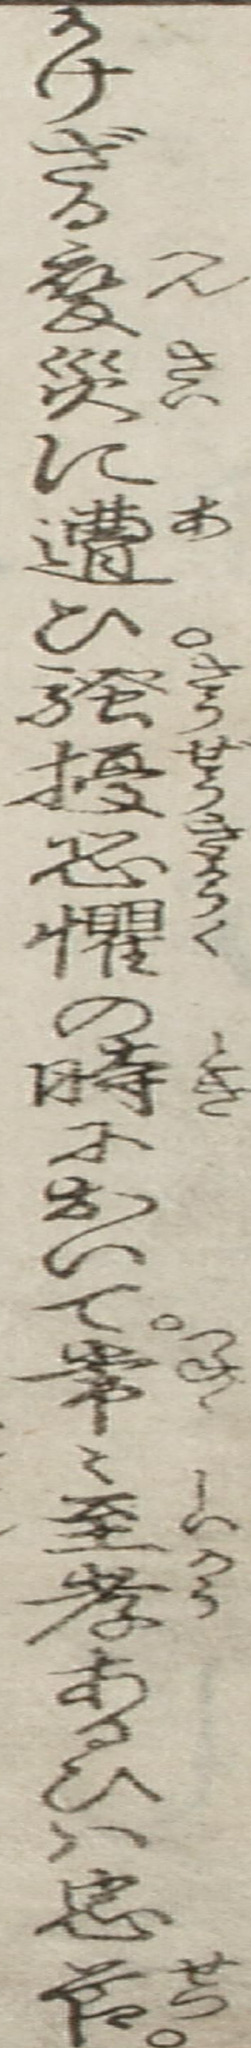かけざる変災に遭ひ。騒擾恐懼の時において。常〻至孝あるひは忠節。
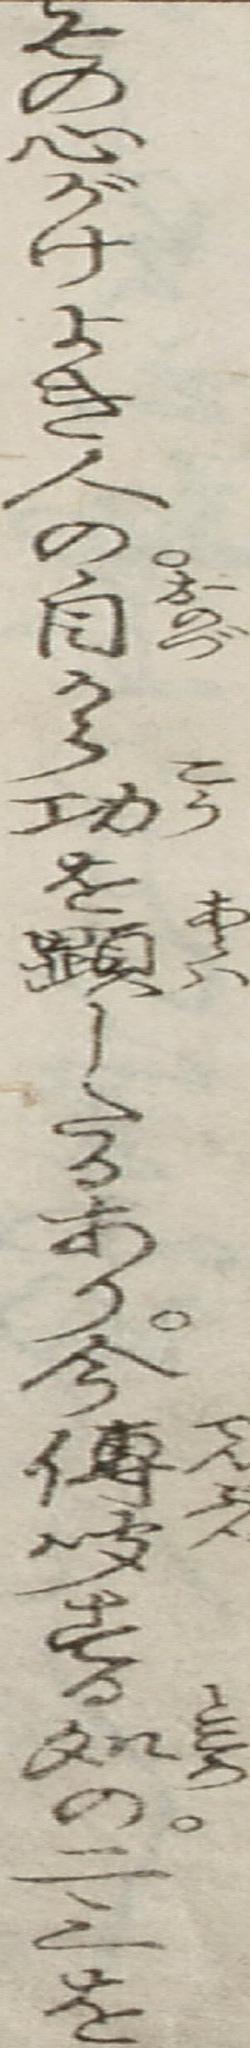その心がけよき人の。自から功を顕したるあり。今伝聞する処の。二三を
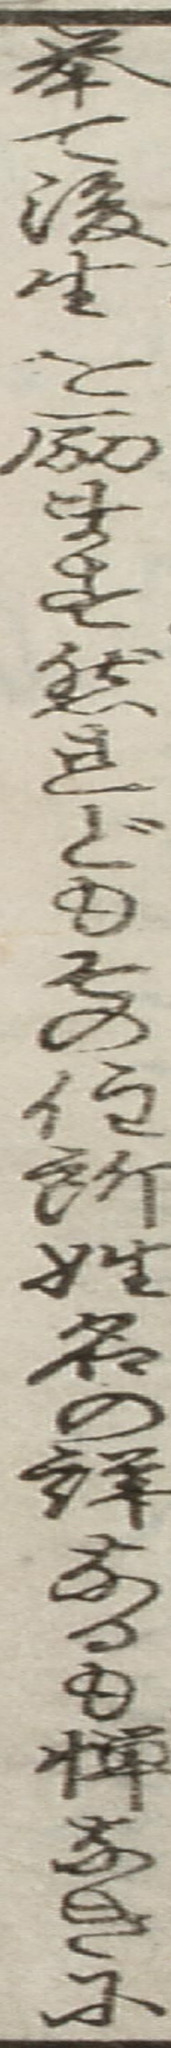挙て後生を励ます。然れどもその住所姓名の詳なるも。憚なきに
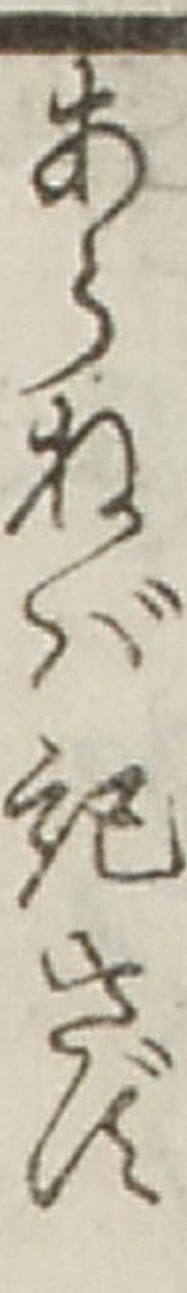あらねば記さず
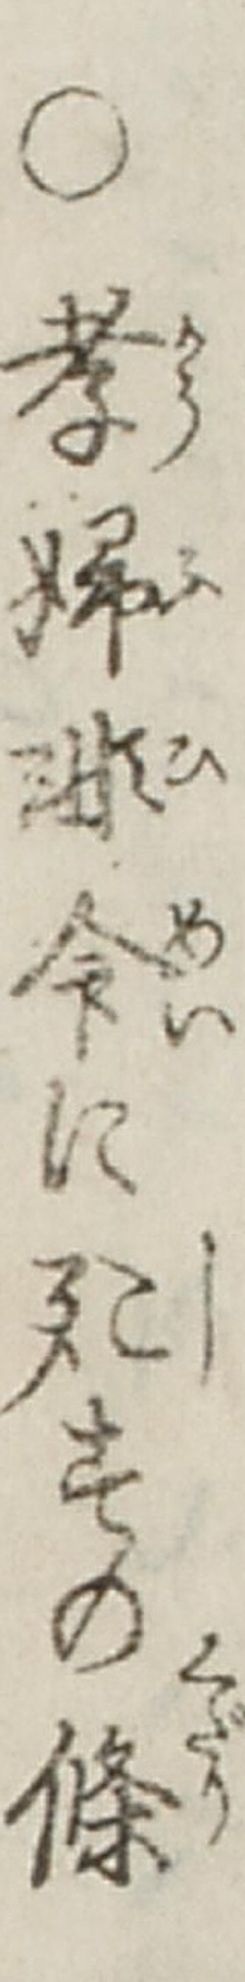○孝婦非命に死すの条
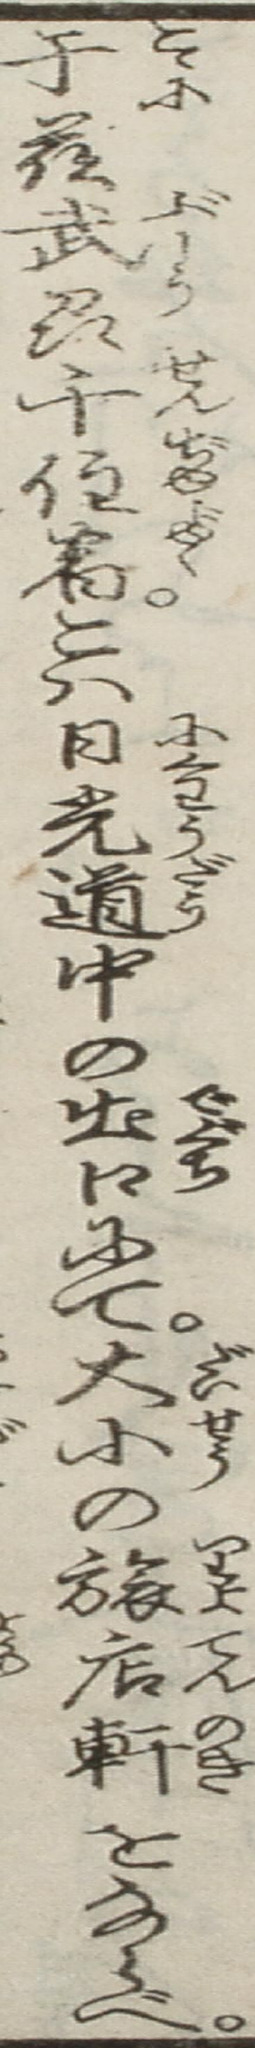于茲武州千住宿。こは日光道中の出口にて。大小の旅店軒をならべ。
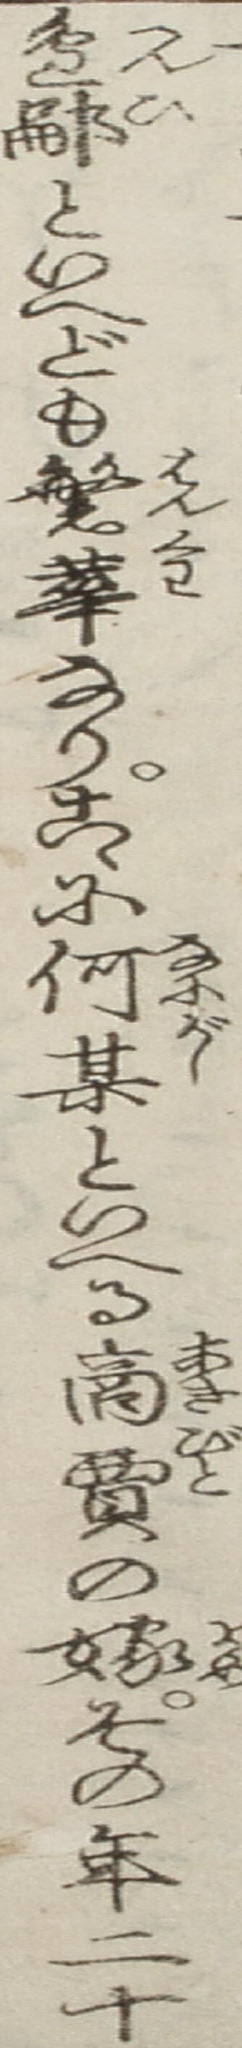辺鄙といへども繁華なり。こゝに何某といへる商賈の嫁。その年二十
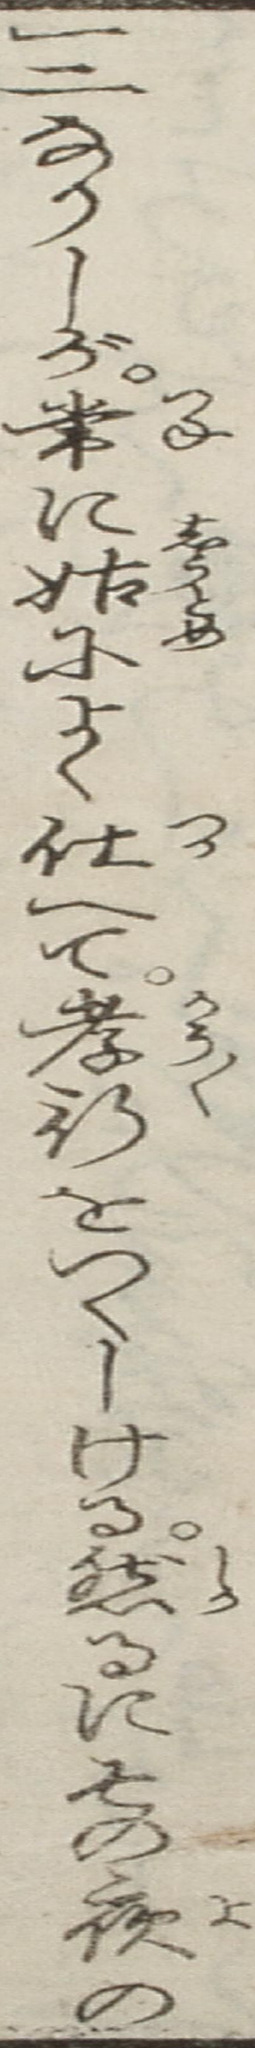一二なりしが。常に姑によく仕へて。孝行をつくしける。然るにその夜の
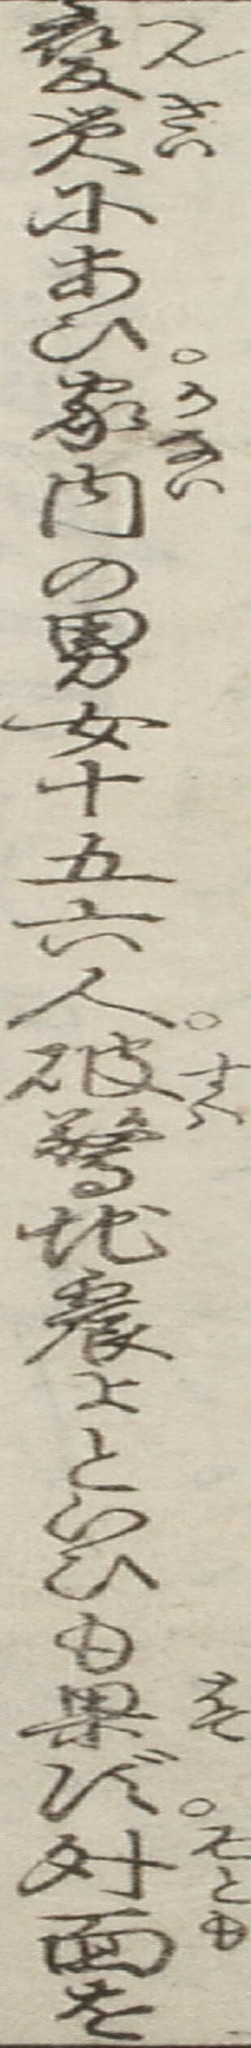変災にあひ。家内の男女十五六人。破驚地震よといひも果ず。外面を
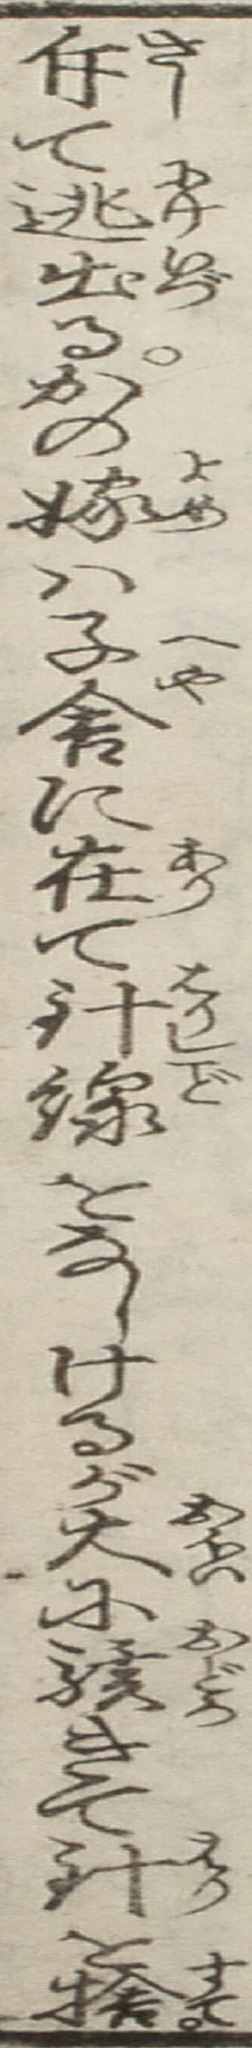斥て逃出る。かの嫁は子舎に在て針線をなしけるが大に駭きて針を捨。
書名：安政見聞録　上
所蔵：東京大学地震研究所図書室 Earthquake Research Institute Library, The University of Tokyo, JAPAN
